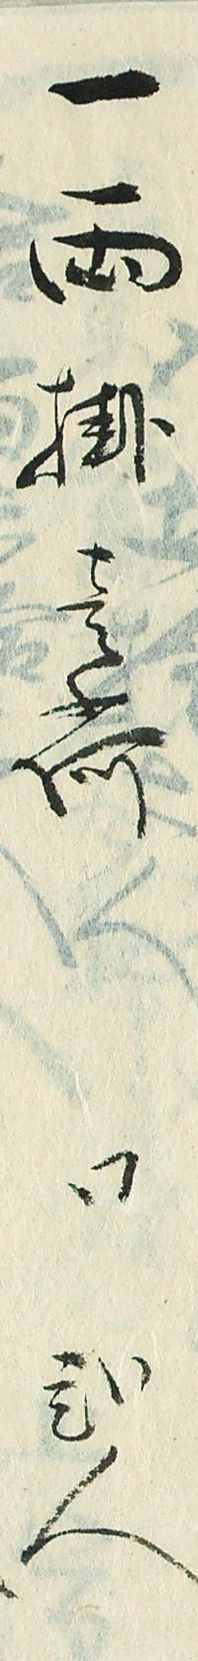一両掛壱荷同弐人
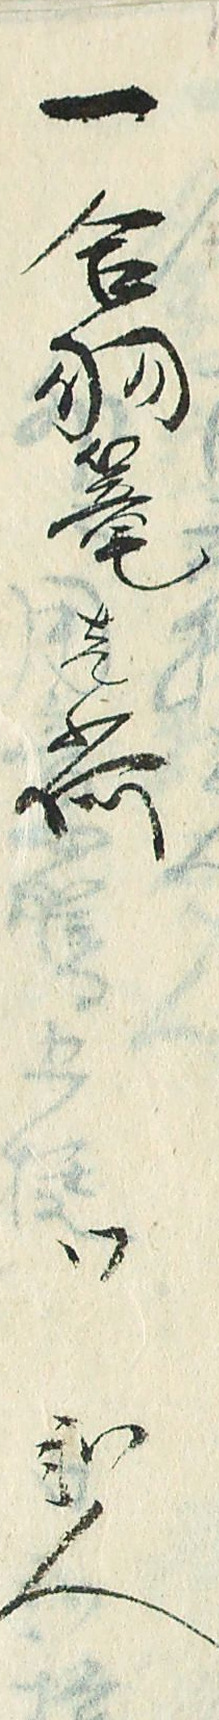一合羽篭壱荷同弐人

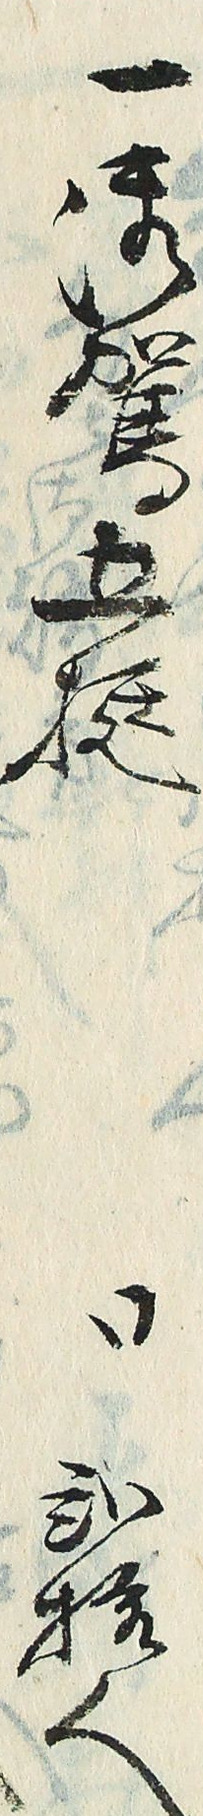一御駕五挺同弐拾人
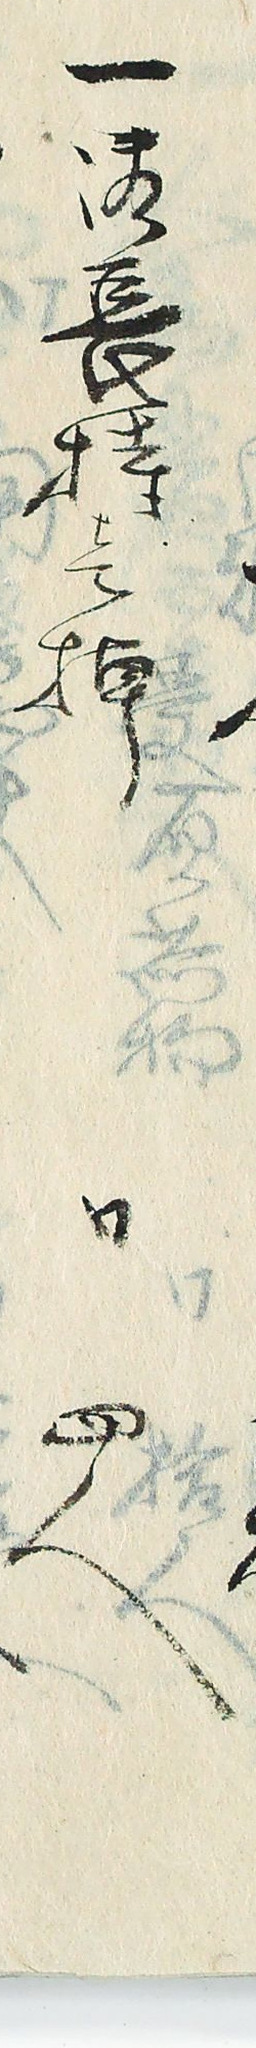一御長持壱棹同四人
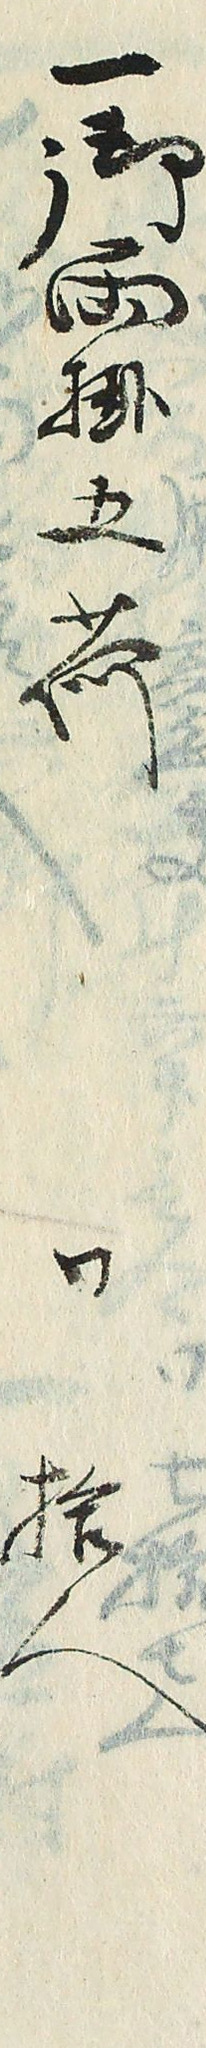一御両掛五荷同拾人
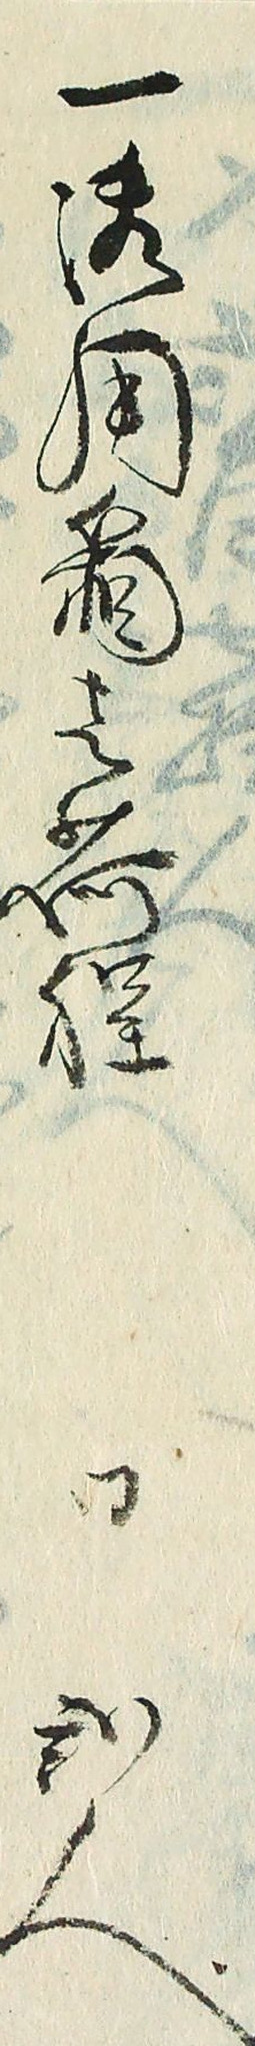一御用箱壱荷程同弐人
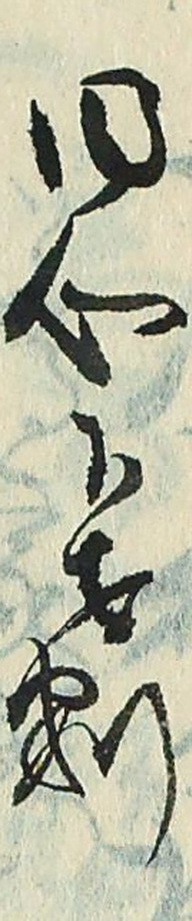同心下才判
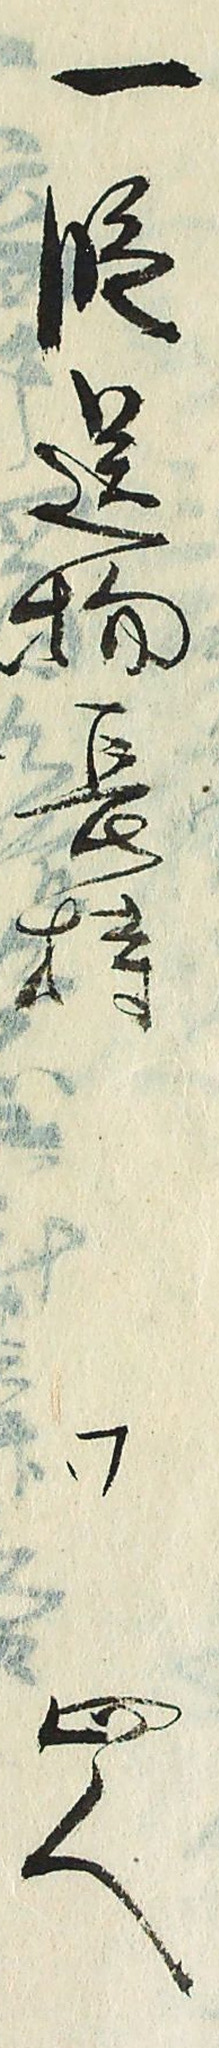一段送物長持同四人
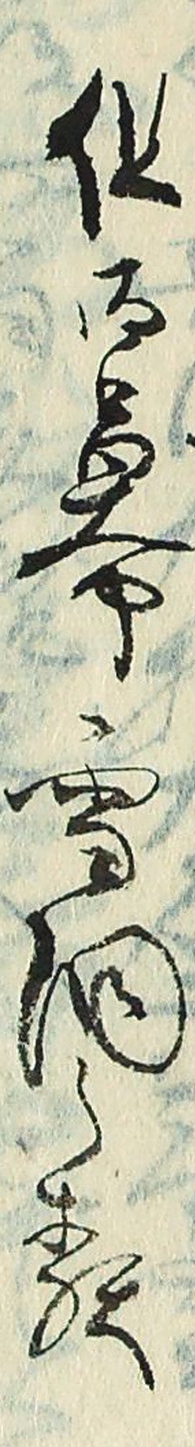但御幕雪洞之類
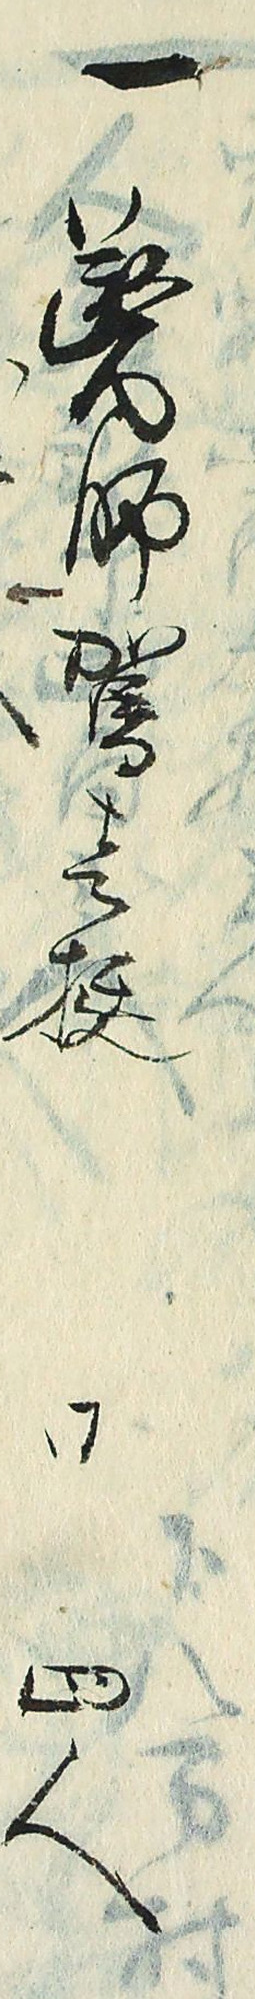一医師駕壱挺同四人
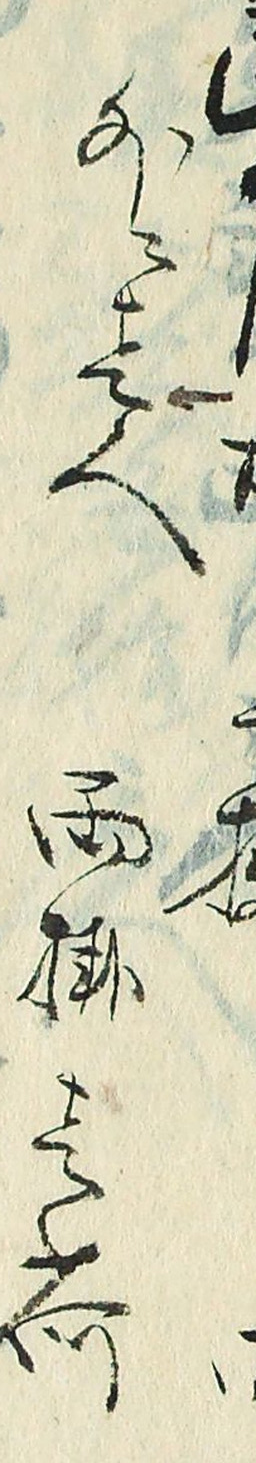外に壱人両掛壱荷
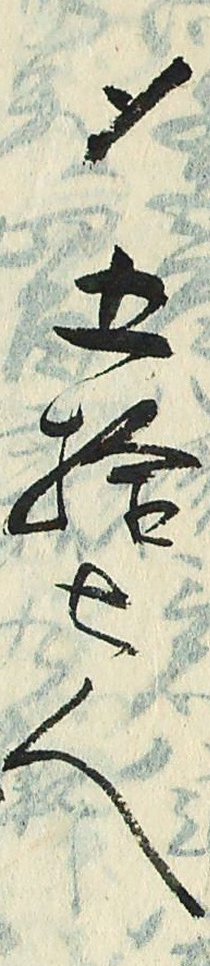〆五拾七人
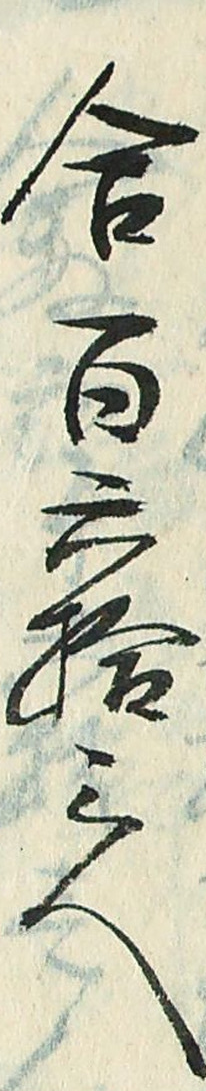合百六拾三人
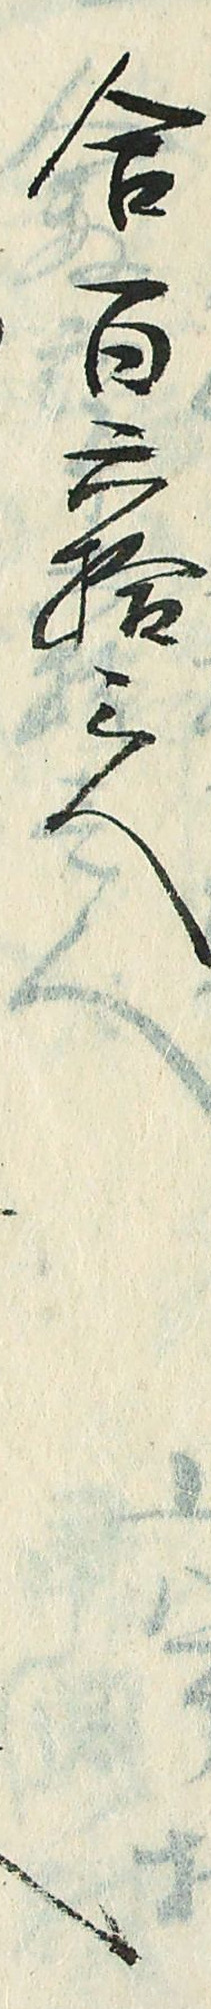合百六拾三人
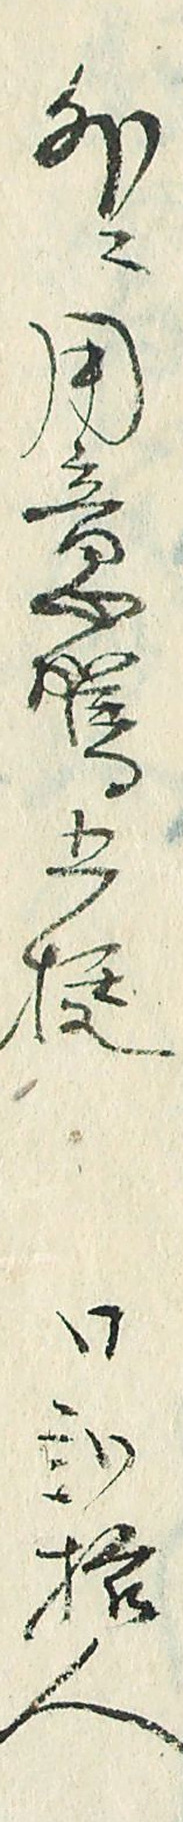外に用意駕五挺同弐拾人

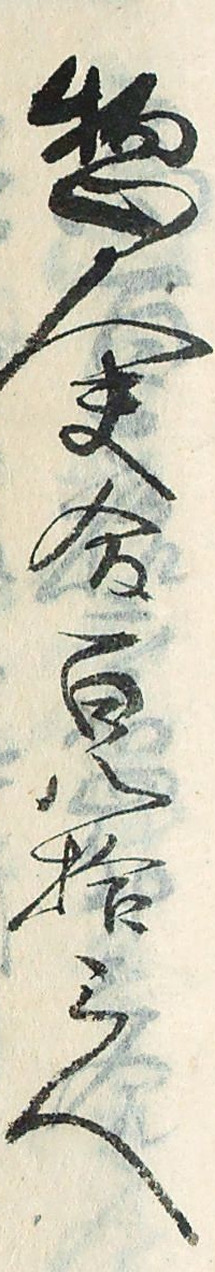惣人夫合百八拾三人
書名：公辺御役人為御廻浦御立越諸御用一巻
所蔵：鳴門教育大学 Naruto University of Education
